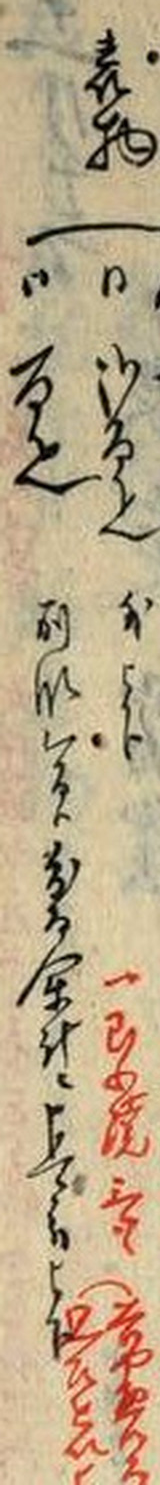同百疋別段今日ハ別而余計ニ申上候ニ付被下
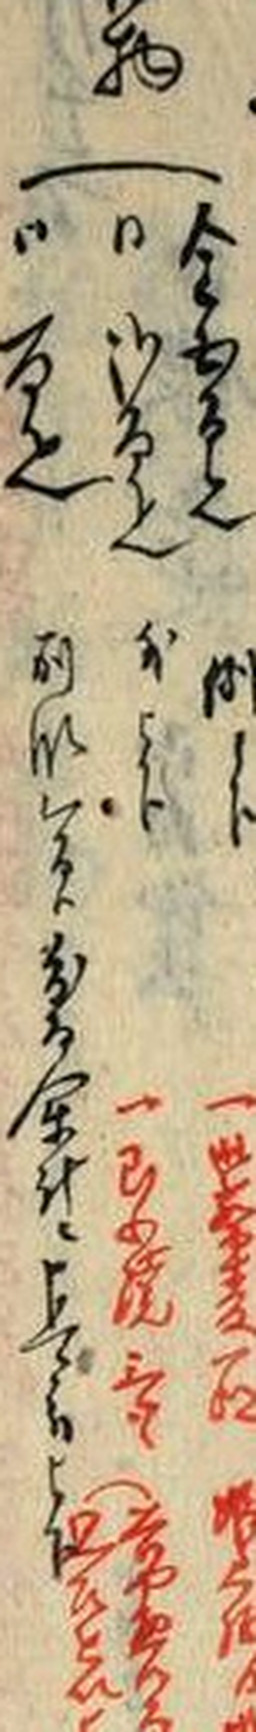同百疋別段今日ハ別而余計ニ申上候ニ付被下

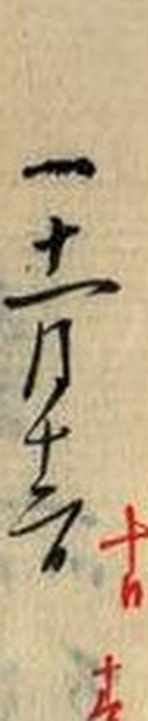一十一月十二日
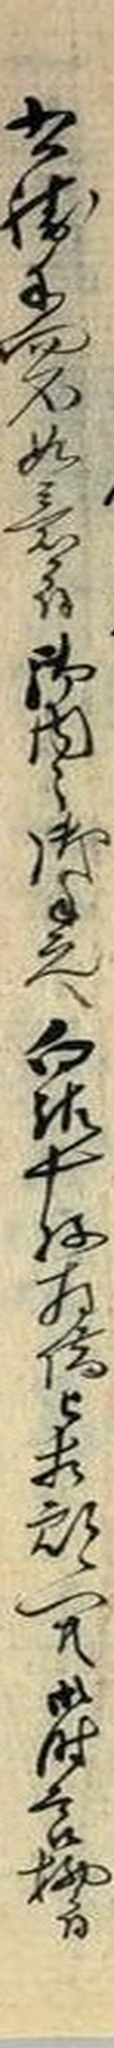右勝手向不如意ニ付御内々御手元へ白銀十枚拝借被相願候へ共御時節柄ニ付
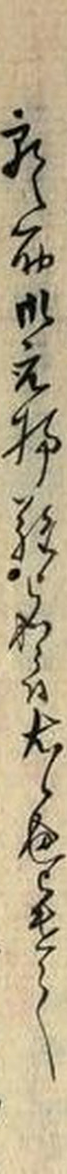願之筋御取揚難被成候付右之通被遣之
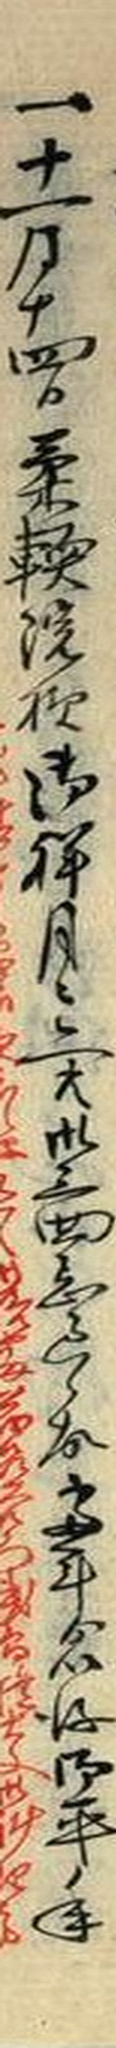一十一月十四日柔輭院様御祥月ニ候へ共御三回忌過候故当年ゟ以後御平年
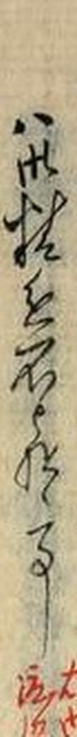ハ御精進不被遊候事
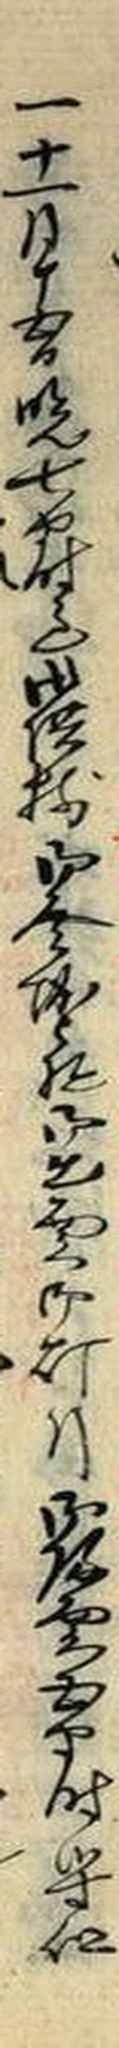一十一月十五日晩七半時過御供揃御登城被遊御出殿御灯引御帰殿五半時弐寸但
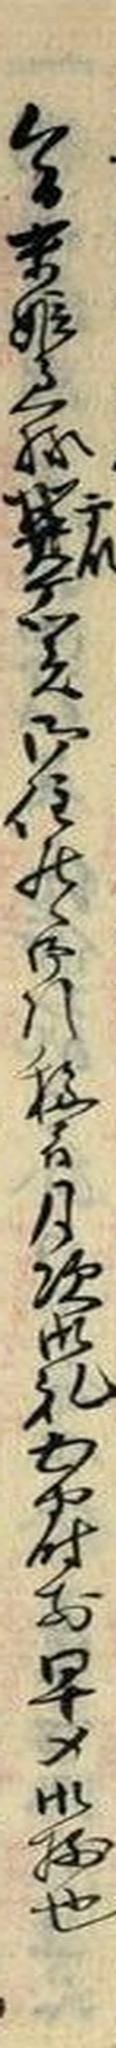今日末姫君様霞ケ関御住居へ御引移ニ付月次御礼五半時前早メ御揃也
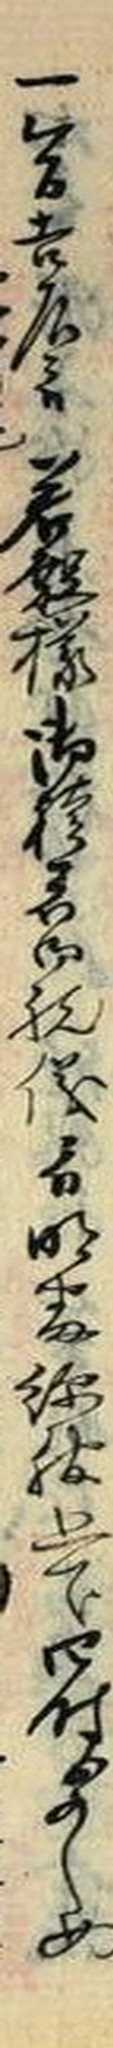一今日吉辰ニ付若殿様御袴着御祝儀ニ付明番綿紗上下四時ゟのしめ
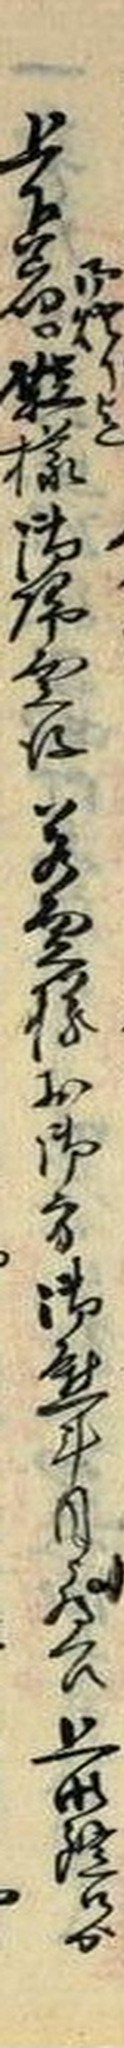上下着◦御燈り迄殿様御帰殿後若殿様於御方御熨斗目被為召上御錠口ゟ
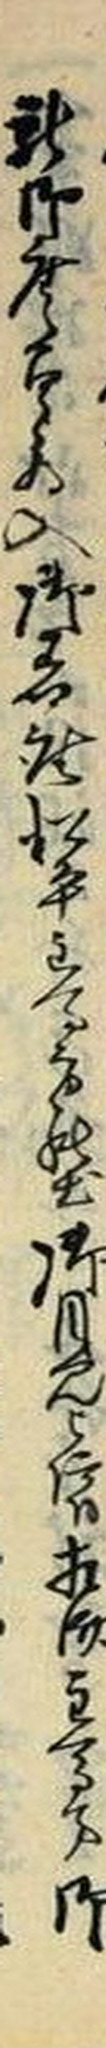新御座之間へ被為入御着座松平主馬方罷出御目見被仰付相済主馬方御
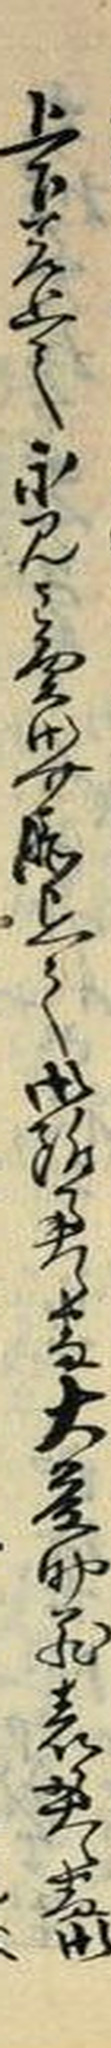上下差上之永見主殿御介添申上之御附奥之番大藤助蔵表奥之番御
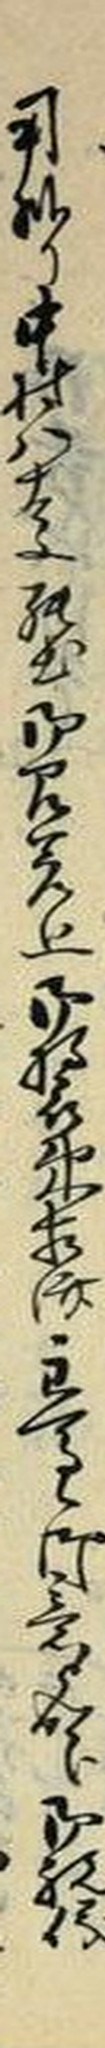用掛り中村八太夫罷出御召差上御装束相済主馬へ御意被成下御祝儀
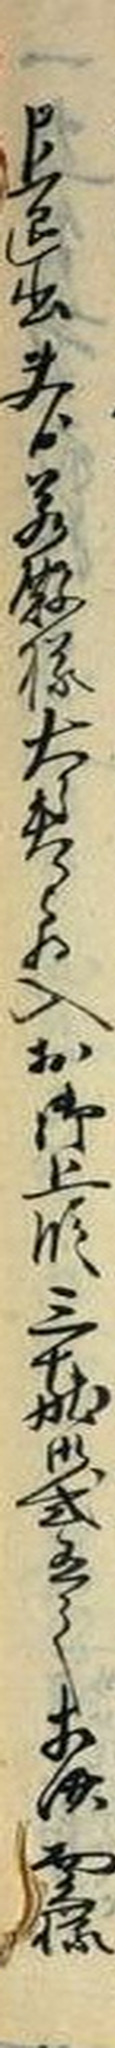申上退出夫ゟ若殿様大奥へ被為入於御上段三献御式有之相済殿様
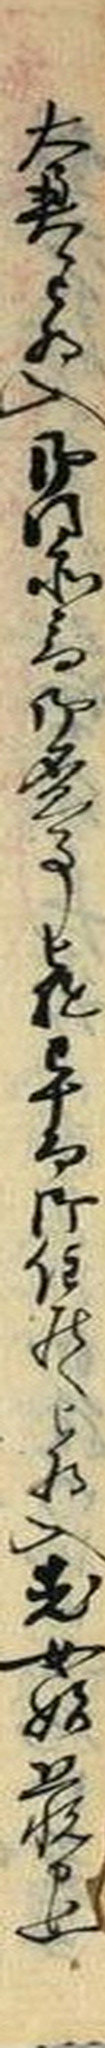大奥へ被為入御同所ニ而御盃事被遊畢而御住居へ被為入老女始恐悦申上
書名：少傅日録抄（斉承付側向頭取日記、在府）
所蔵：福井県文書館 Fukui Prefectural Archives
